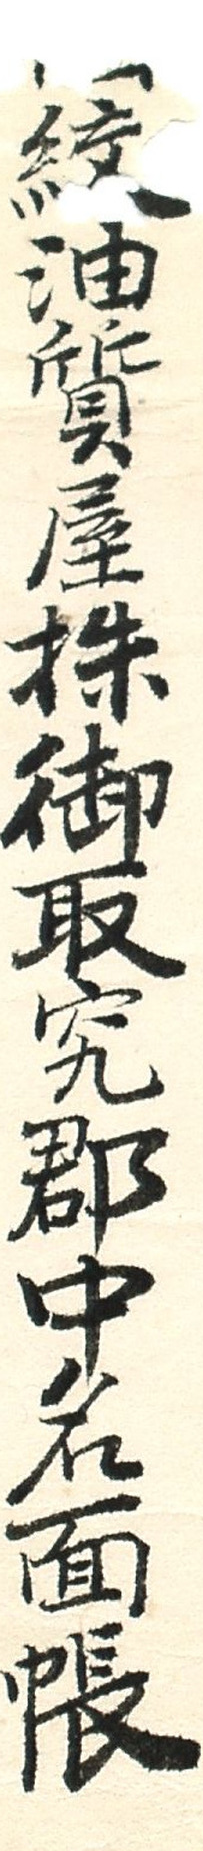絞油株質屋株御取究郡中名面帳
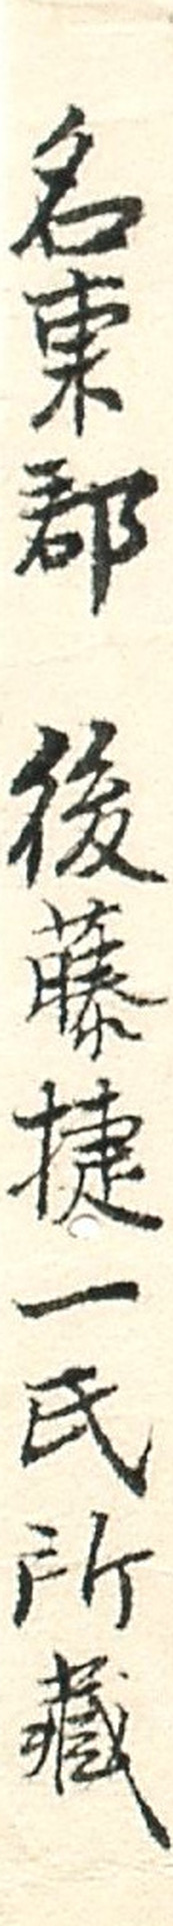名東郡後藤捷一氏所蔵

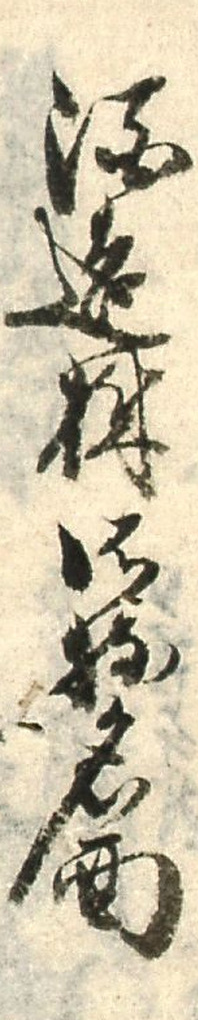酒造株御極名面
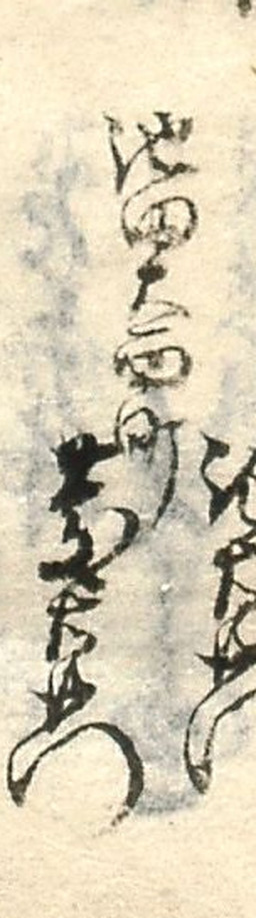池田大西町慶右衛門
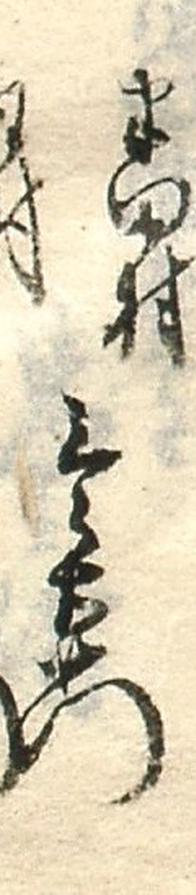半田村三郎右衛門
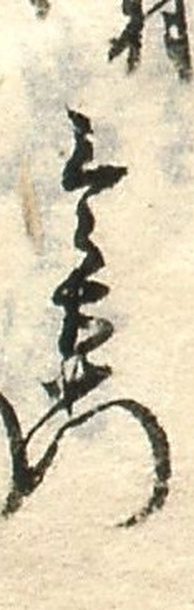半田村三郎右衛門
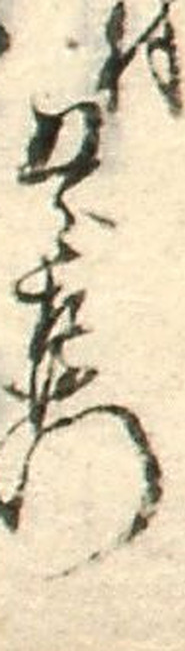西林村五郎左衛門
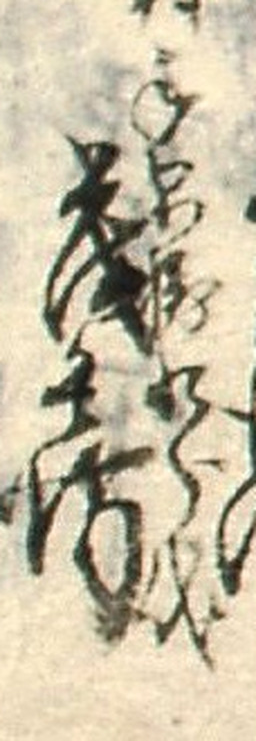茂兵衛

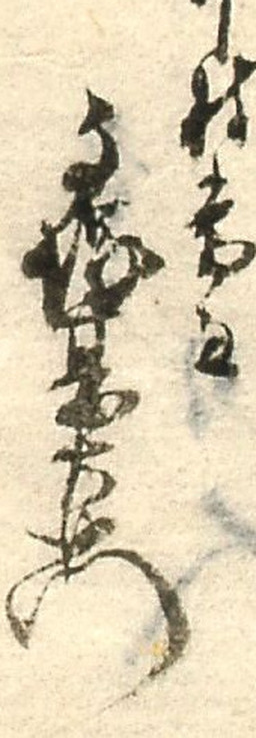手塚甚右衛門
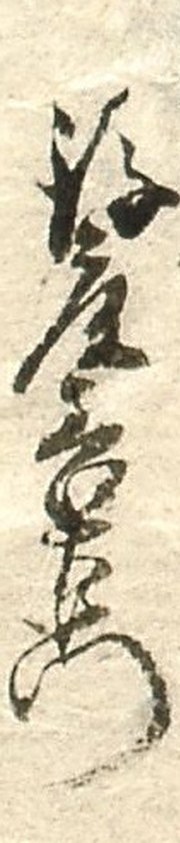屋善右衛門

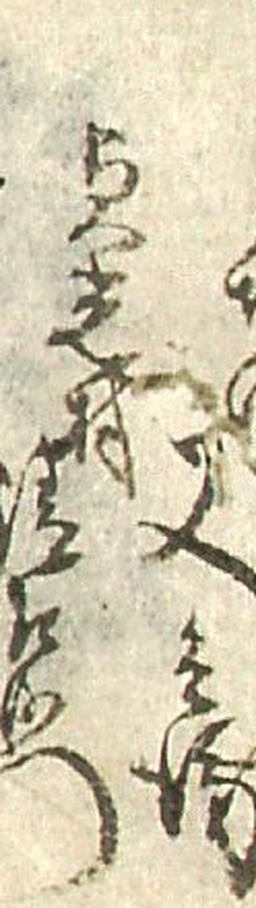貞光村新左衛門
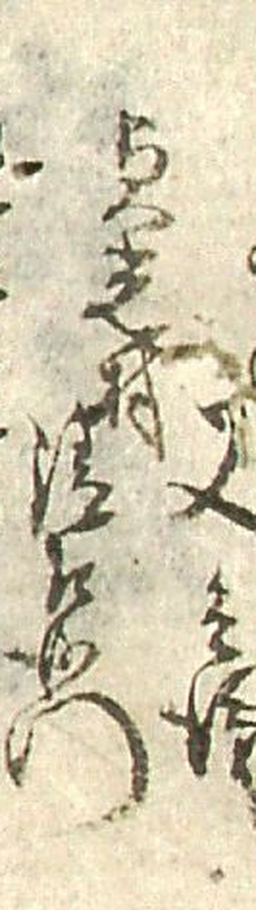貞光村新左衛門
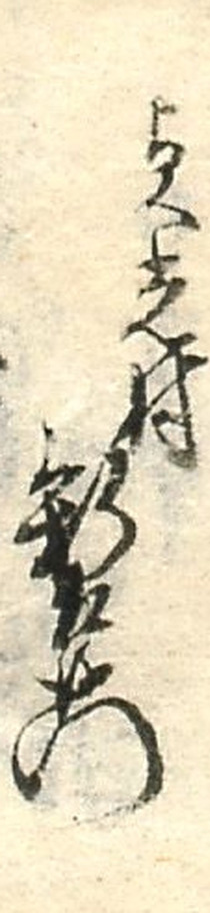貞光村新左衛門
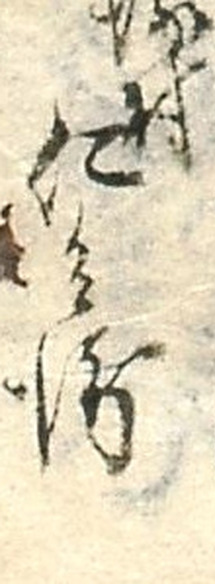忠兵衛
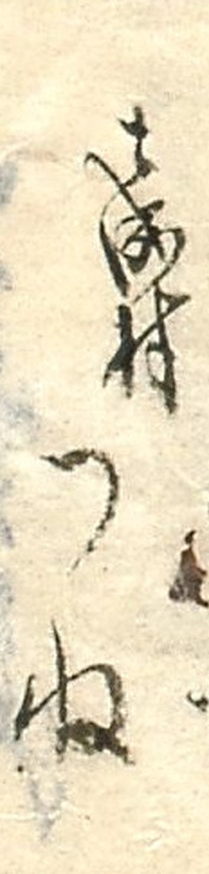土成村つね
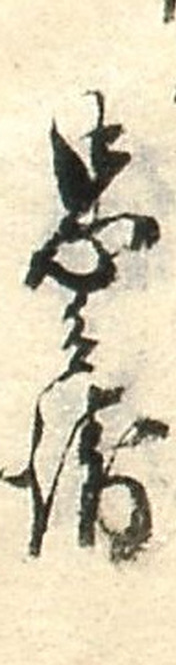忠兵衛
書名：郷酒株絞油株質屋株御取窮郡中名面帳並諸郡株数相改帳
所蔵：鳴門教育大学 Naruto University of Education
